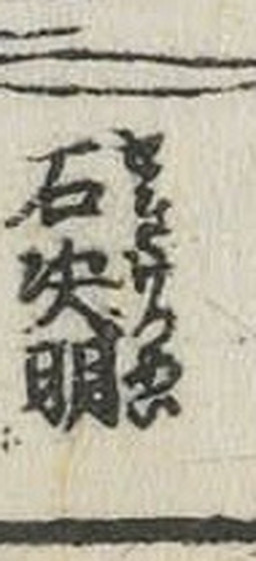石決明
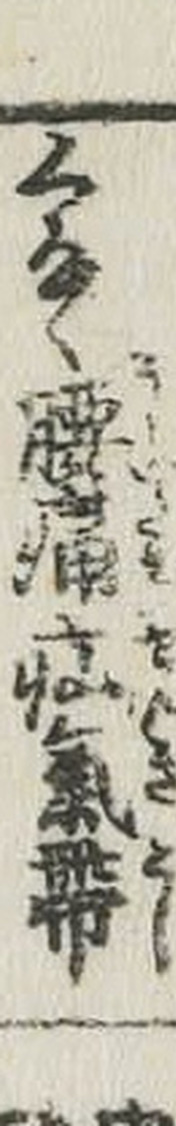くなく腰痛疝気帯
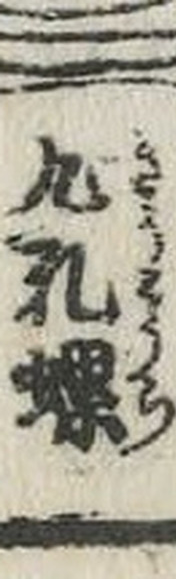九孔螺
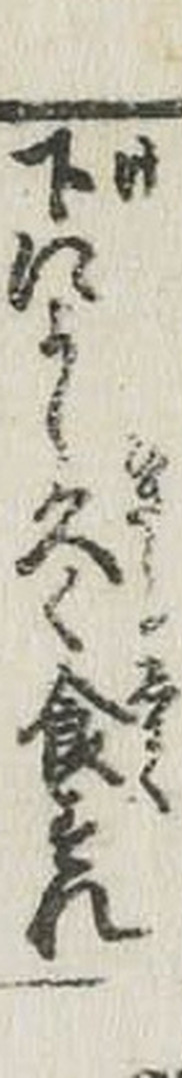下によし久く食すれ
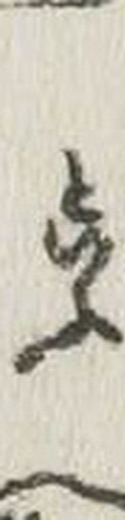といふ
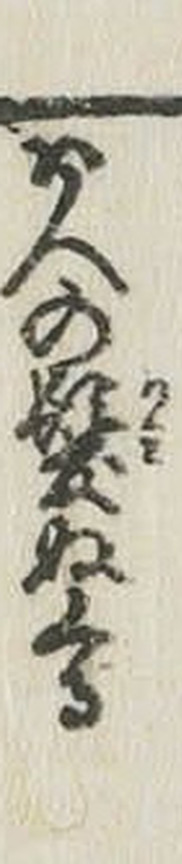は人の髪ぬくる
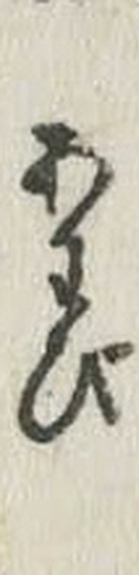あわび
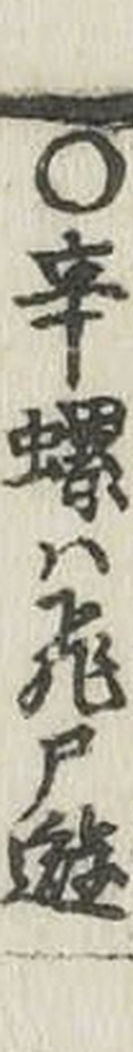○辛螺は飛尸遊
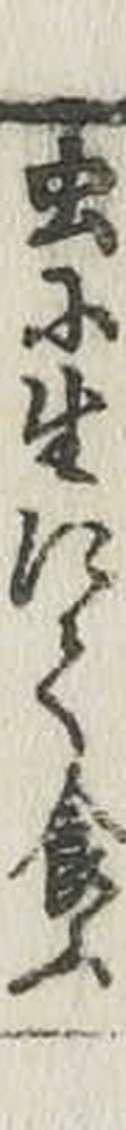虫に生にて食ふ
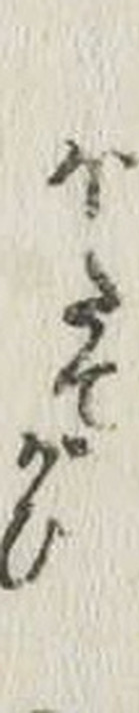ほたてがひ
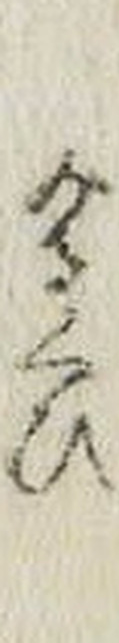みるくひ
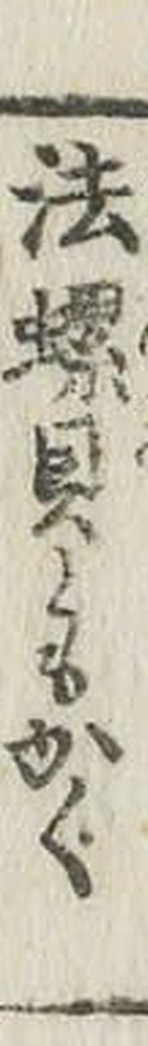法螺貝ともかく
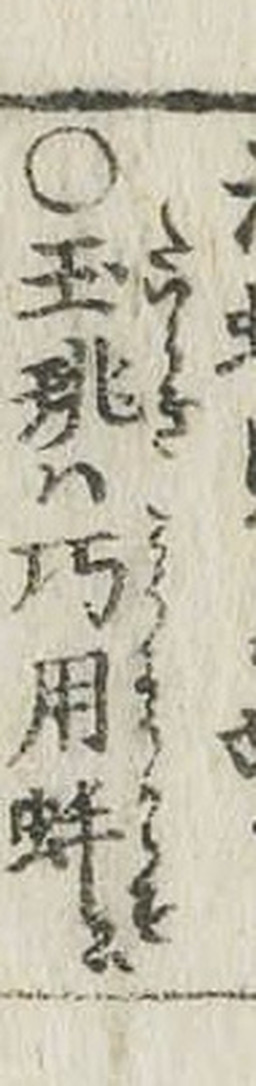○玉珧は巧用蚌
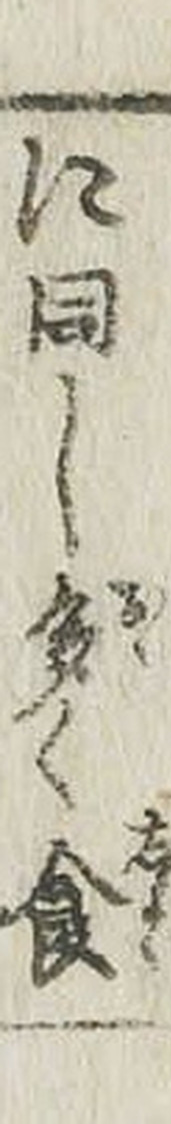に同し多く食
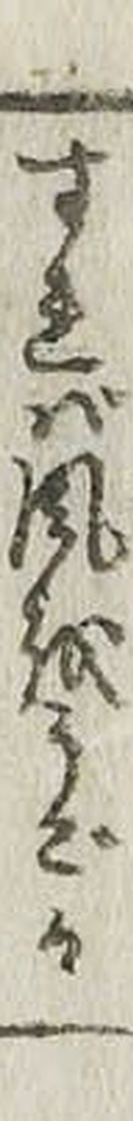すれば風をうごか
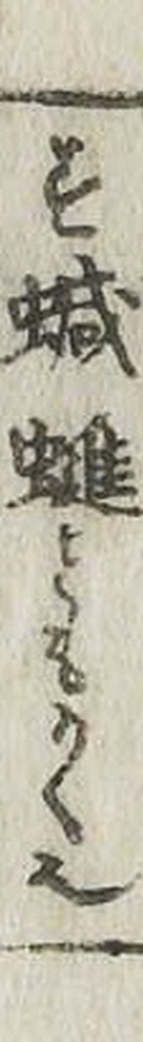す𧍧䗯ともかく也
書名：増補頭書訓蒙図彙大成 10巻 7:巻之14-16
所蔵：東京学芸大学教育コンテンツアーカイブ
